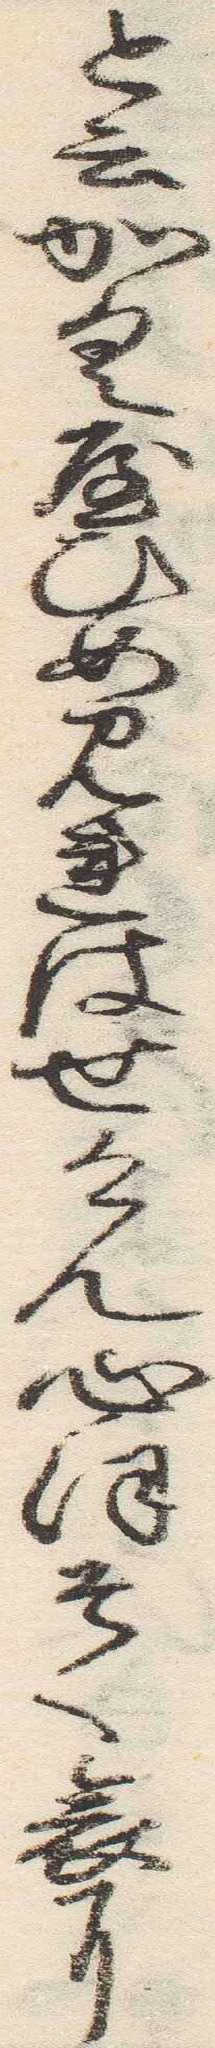と云かくやひめ見れはせけん心ほそく哀に
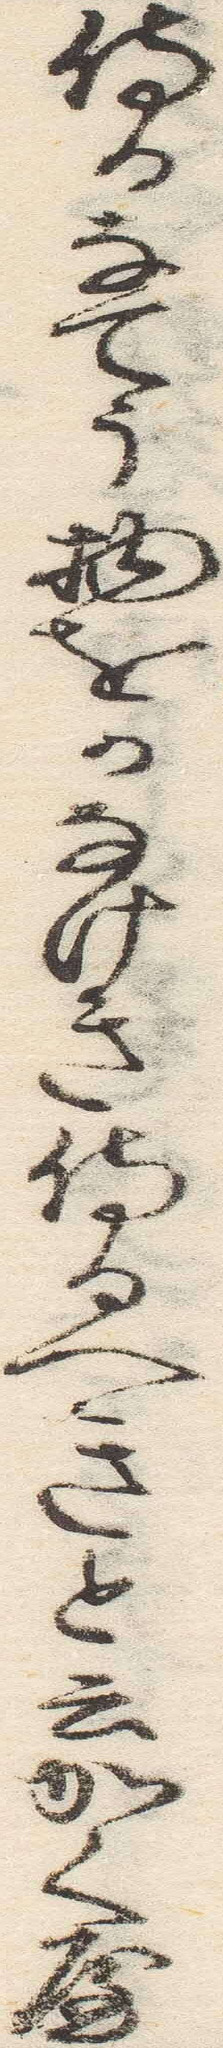侍るなてう物をかなけき侍るへきと云かくや
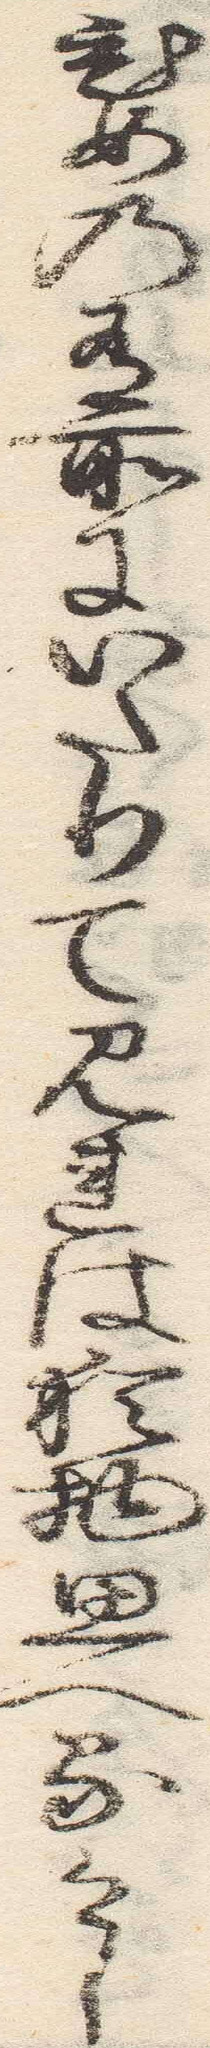ひめの有所にいたりて見れは猶物思へるけし
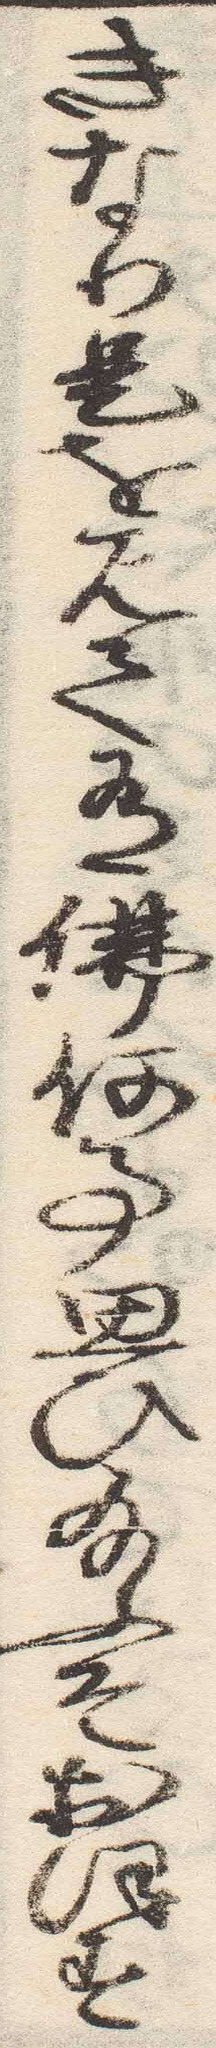きなり是を見て有仏何事思ひ給ふそおほす
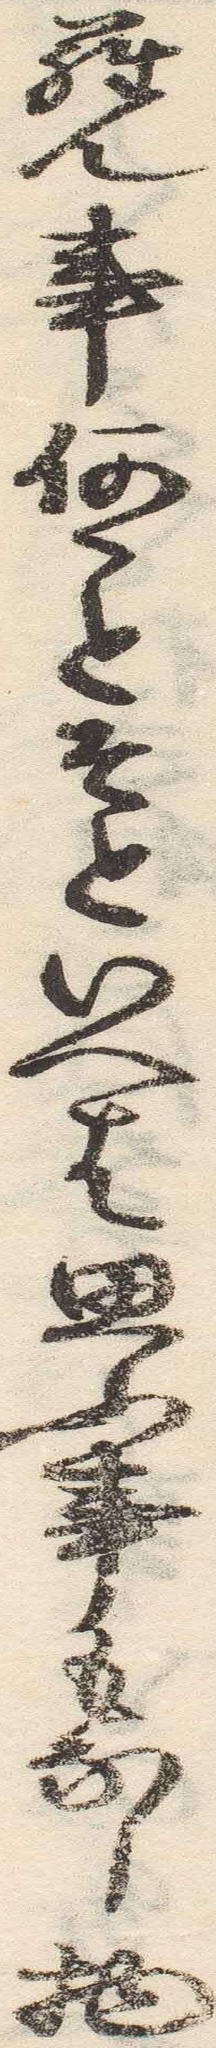らん事何ことそといへは思ふ事もなし物
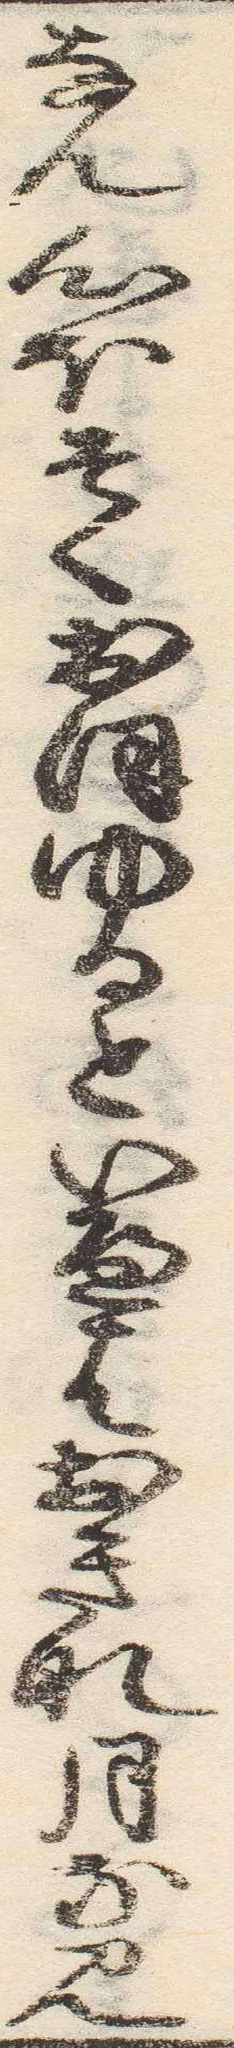なん心ほそくおほゆるといへはおきな月な見
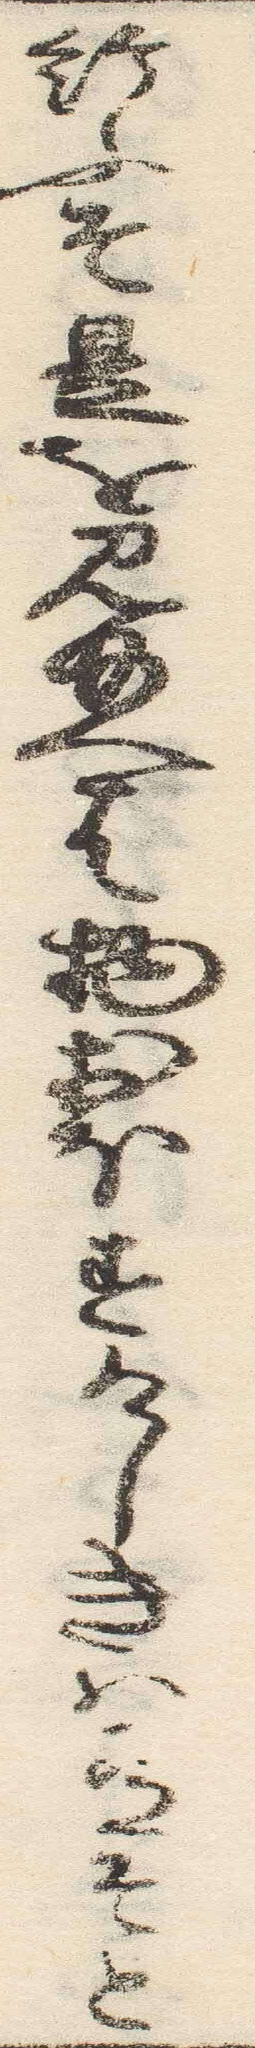給ふそ是を見給へは物おほすけしきは有そと
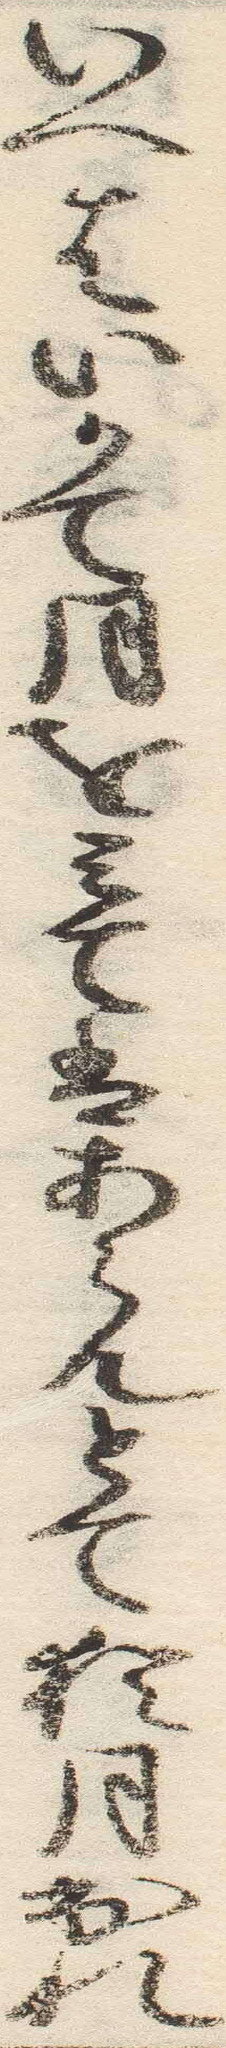いへはいかて月をみてはあらんとて猶月出れ
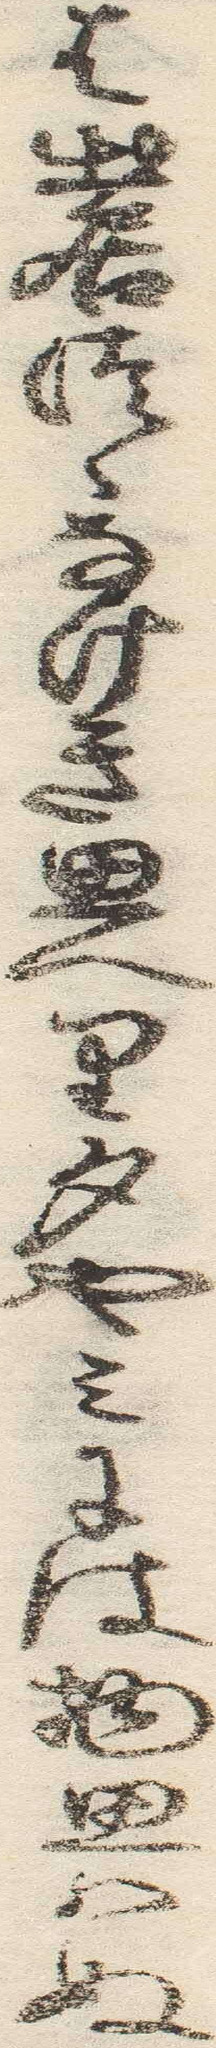は出居つゝなけき思へり夕やみには物思はぬ
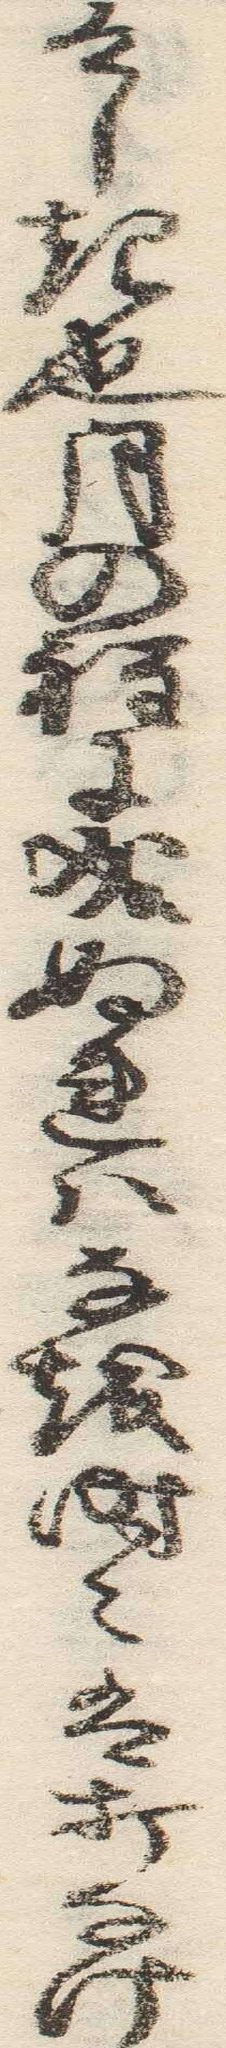けしき也月の程に也ぬれはなを時々は打なけ
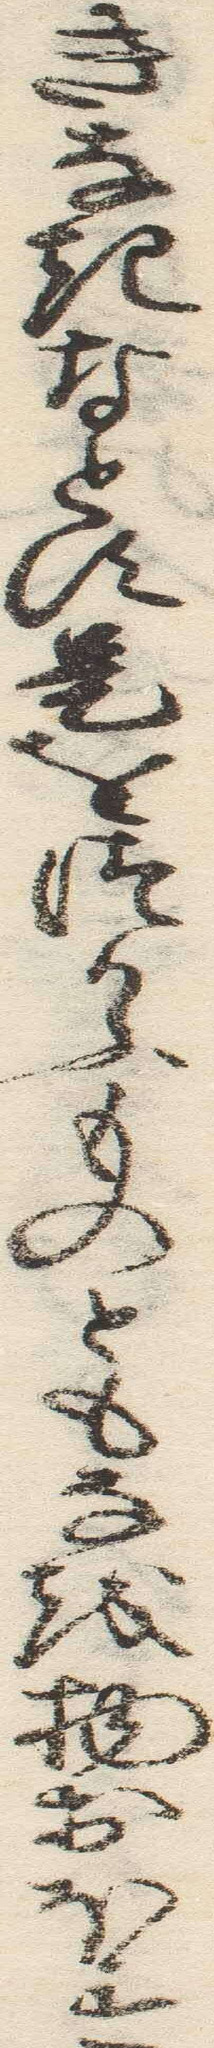きなきなとす是をつかふものともなを物おほす
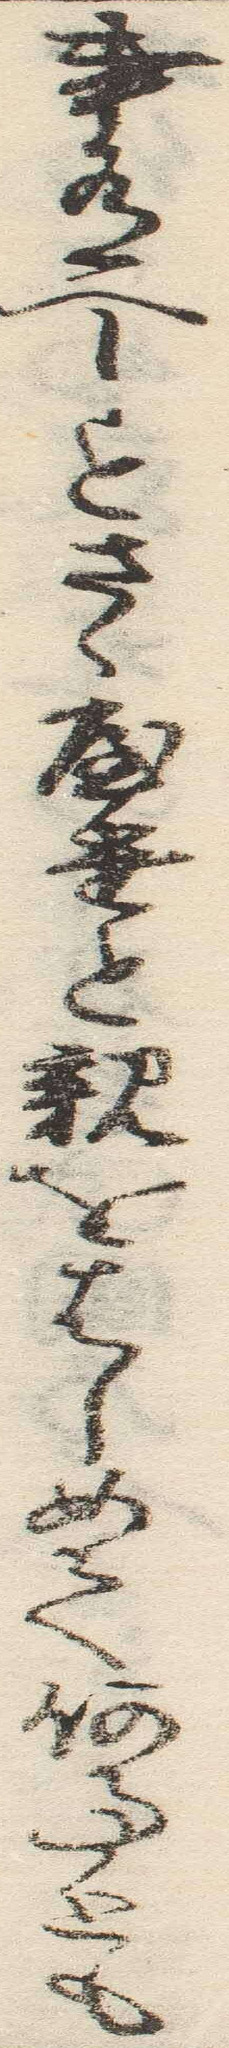事有へしとさゝやけと親をはしめて何事とも
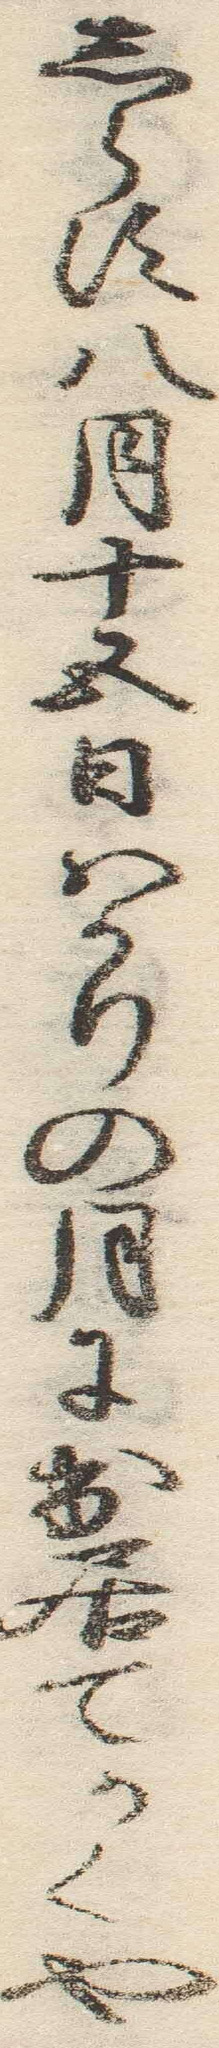しらす八月十五日はかりの月に出居てかくや
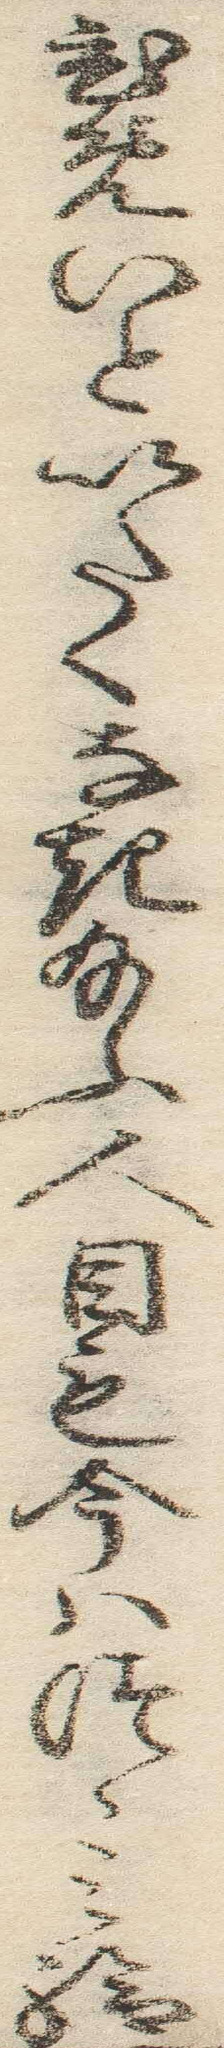ひめいといたくなき給ふ人目も今はつゝみ給
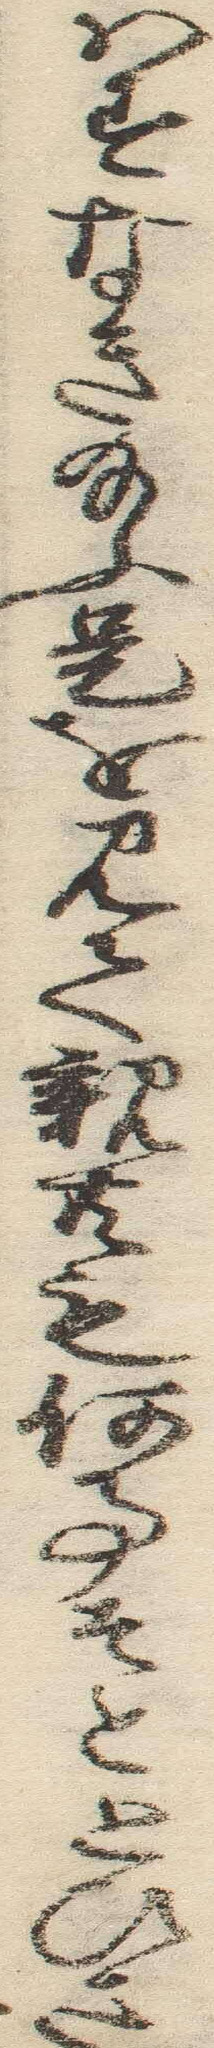はすなき給ふ是を見て親共も何事そととひさ

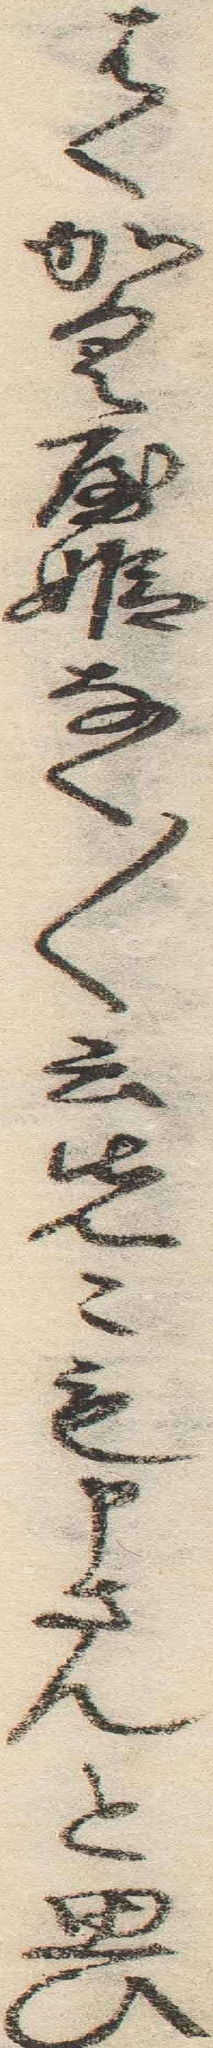はくかくや姫なく〳〵云先々も申さんと思ひ
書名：竹取物語
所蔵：東京学芸大学附属図書館 国文学研究資料館
